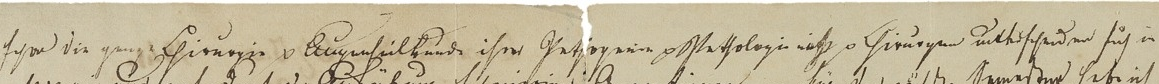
ihrer Pathogenie & Pathologie nach & Chirurgen unterscheiden sich in
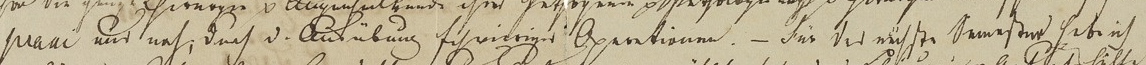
praxi nur noch durch d. Ausübung schwieriger Operationen. – Für das nächste Semester habe ich
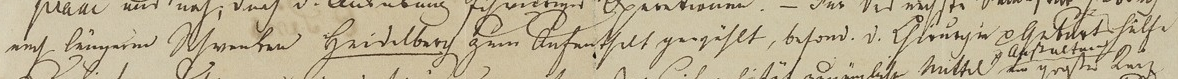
nach längerm Schwanken Heidelberg zum Aufenthalt gewählt, besond.d. Chirurgie & Geburtshülfe
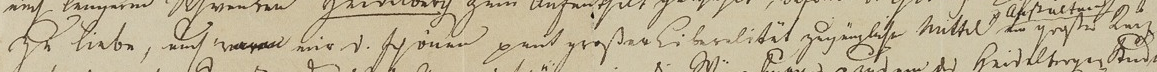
zu liebe, auch waren mir d. schönen & mit großer Liberalität zugänglichen Mittel u Anstalten ein
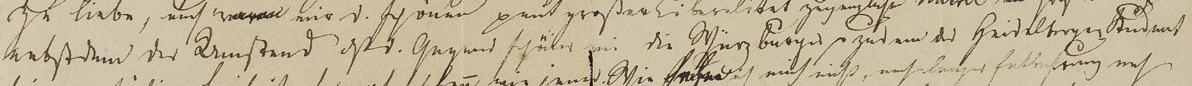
nebstdem der Umstand dßd. Gegend schöner wie die Würzburger & zudem der Heidelberger Student
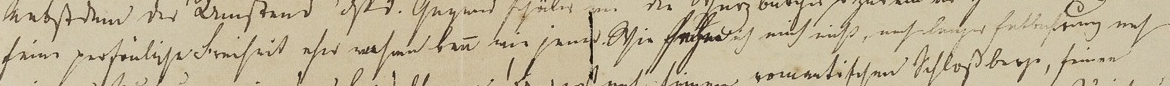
seine persönliche Freiheit eher wahren kann wie jene. Wie sehne ich mich nicht, nach langer Entbehrung nach
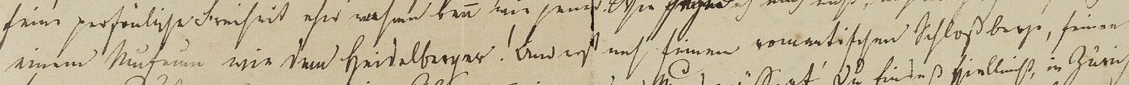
einem Museum wie dem Heidelberger. Und erst nach seinem romantischen Schloßberge, seinen
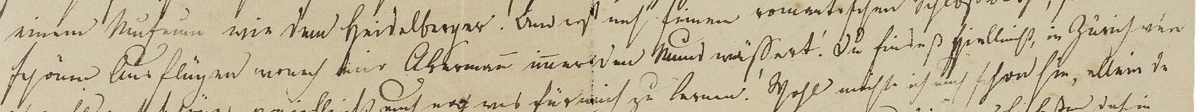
schönen Ausflügen wonach mir Akermann immer den Mund wässert! Du findest vielleicht, in Zürich wäre
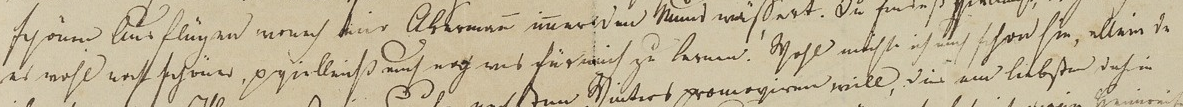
es wohl noch schöner, & vielleicht auch noch was für mich zu lernen! Wohl möchte ich auch schon hin, allein da
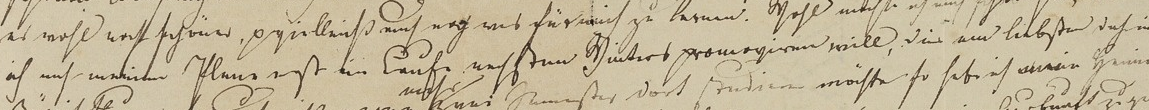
ich nach meinem Plane erst im Laufe nachsten Winters promoviren will, dies am liebsten doch in
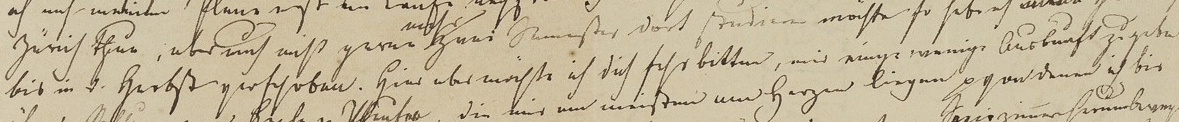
bis in d. Herbst verschoben. Hier aber möchte ich dich sehr bitten, mir einige wenige Auskunft zu geben
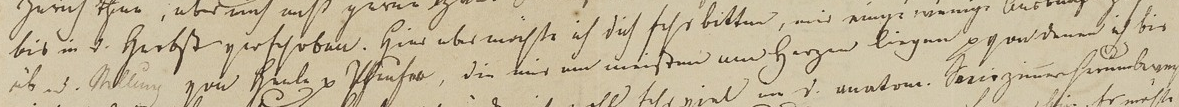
üb. d. Stellung von Henle & Pfeufer, die mir am meisten am Herzen liegen & von denen ich bis
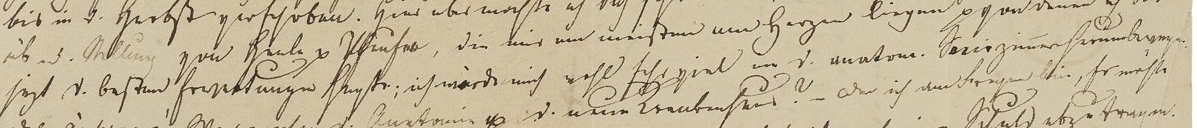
jezt d. besten Erwartungen hegte; ich würde mich wohl sehr viel in d. anatom. Secirzimmer herumbewegen.
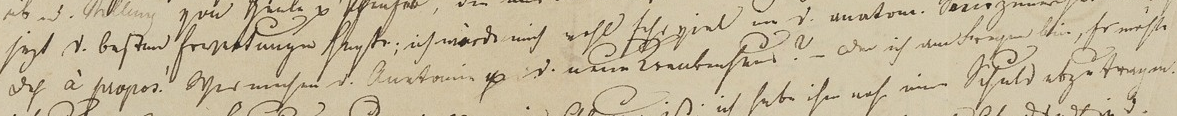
Doch à propos! Was machen d. Anatomie &d. neue Krankenhaus? – Da ich am Fragen bin, so möchte
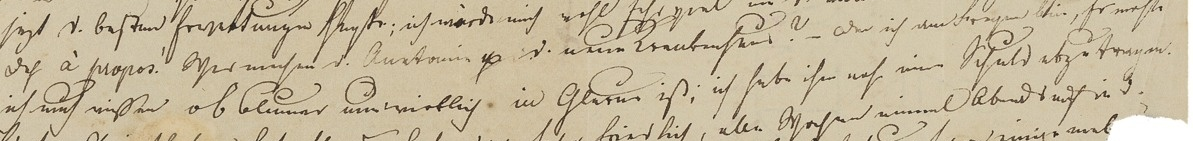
ich auch wissen ob Blumer nun wirklich in Glarus ist; ich habe ihm noch eine Schuld abzutragen.
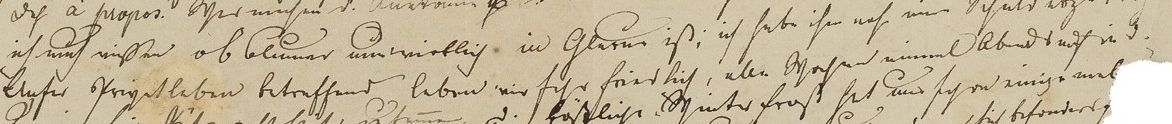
Unser Privatleben betreffend leben wir sehr friedlich, alle Wochen einmal Abends auf in d.
